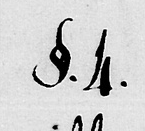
§.4.
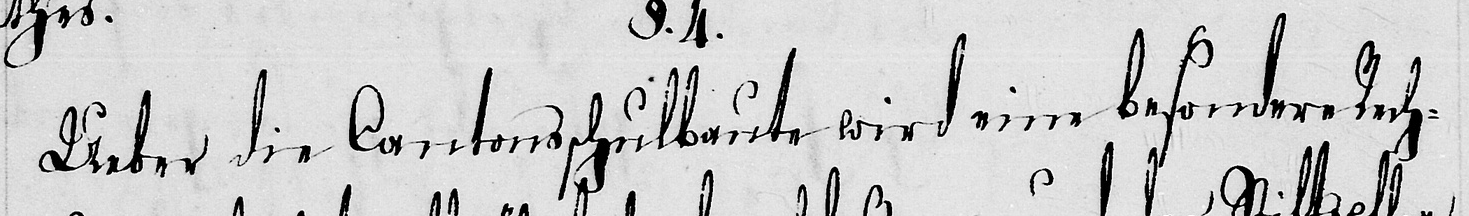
Ueber die Cantonsschulbaute wird eine besondere Rech¬
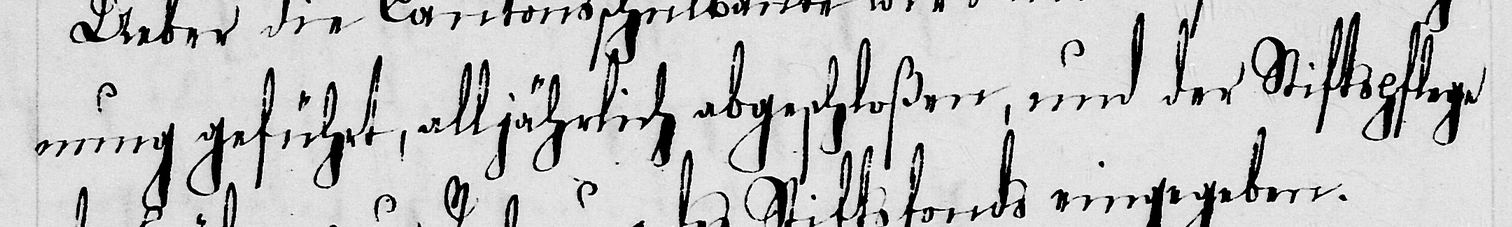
nung geführt, alljährlich abgeschloßen, und der Stiftspflege
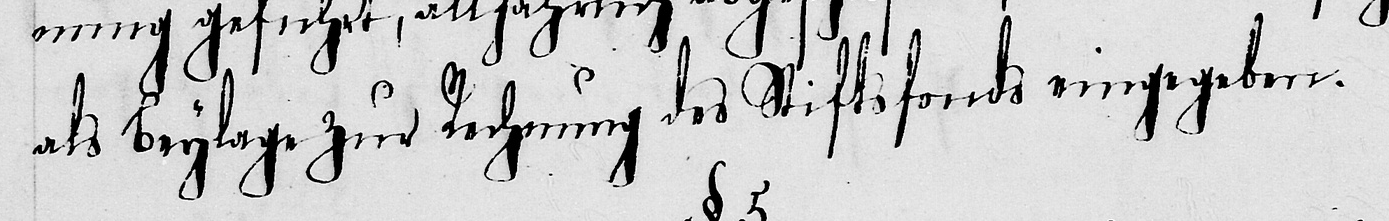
als Beylage zur Rechnung des Stiftsfonds eingegeben.
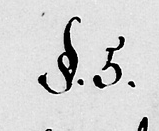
§.5.
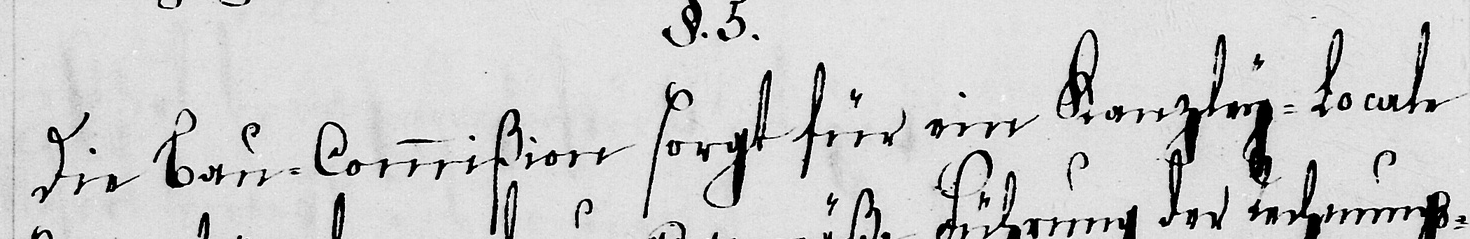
Die Bau-Commißion sorgt für ein Kanzley-Locale
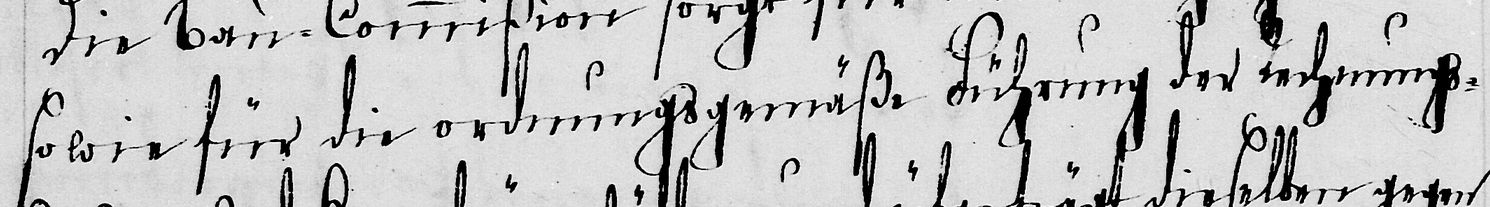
sowie für die ordnungsgemäße Führung der Rechnung¬
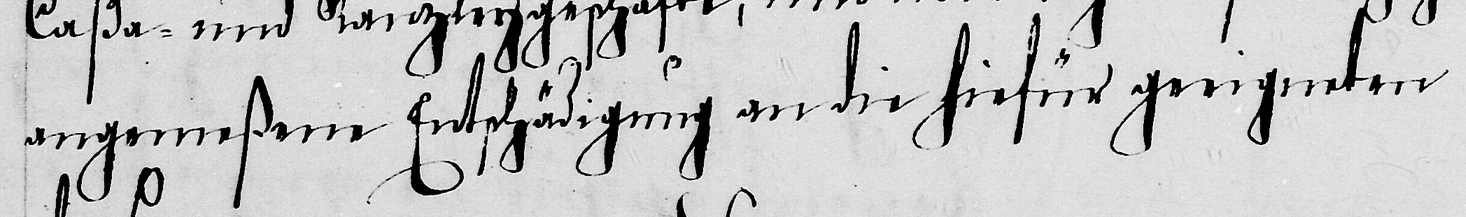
angemeßene Entschädigung an die hiefür geeigneten
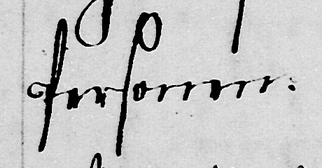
Personen.
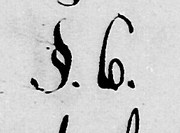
§.6.
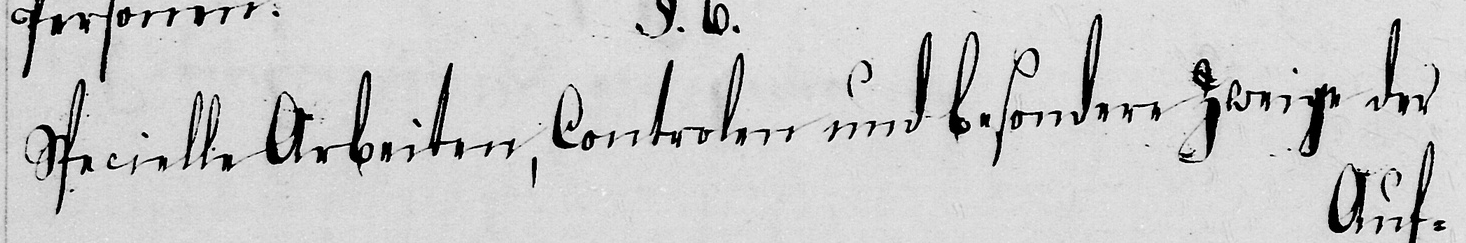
Specielle Arbeiten, Controlen und besondere Zweige der
